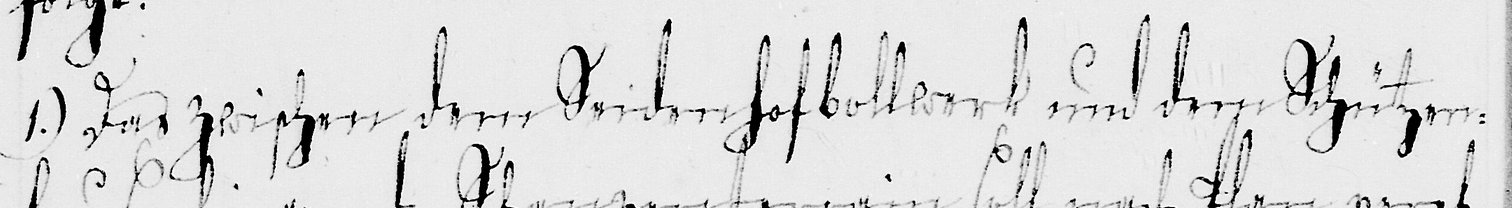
1.) Das zwischen dem Seidenhofbollwerk und dem Schützen¬
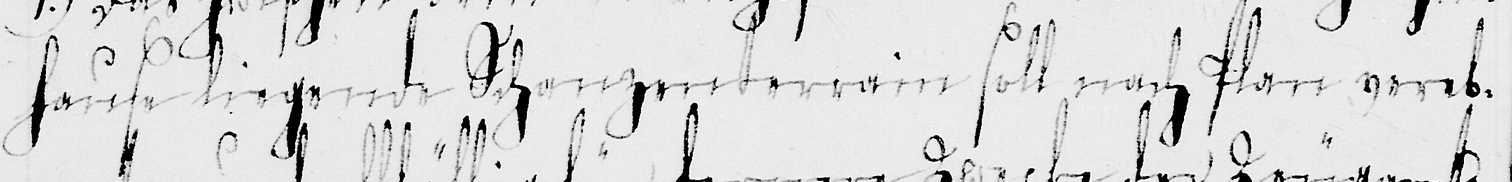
hause liegende Schanzenterrain soll nach Plan vereb¬
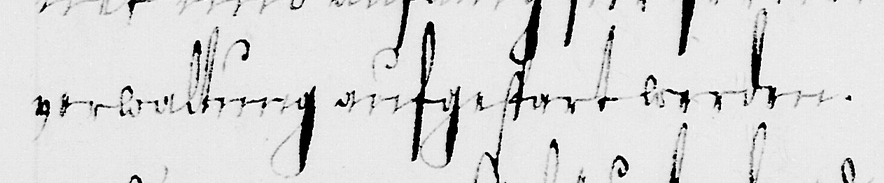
verwaltung aufgespart werden.
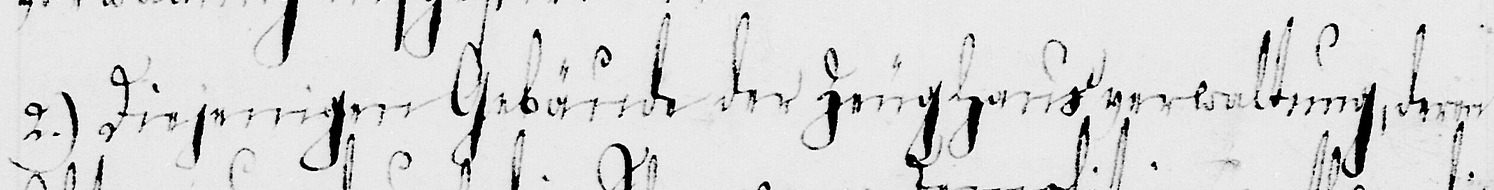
2.) Diejenigen Gebäude der Zeughausverwaltung, deren
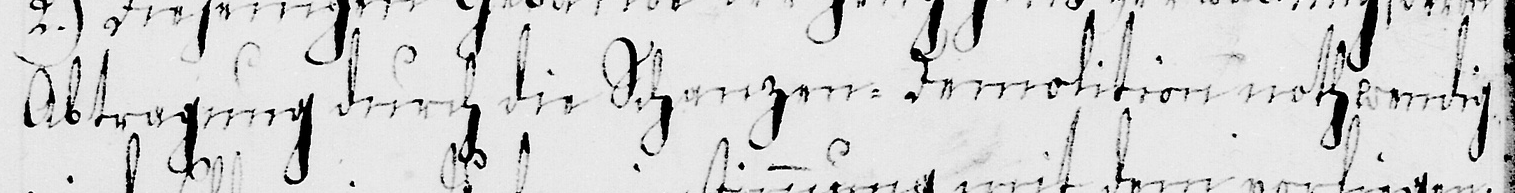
Abtragung durch die Schanzen-Demolition nothwendig
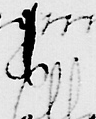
he
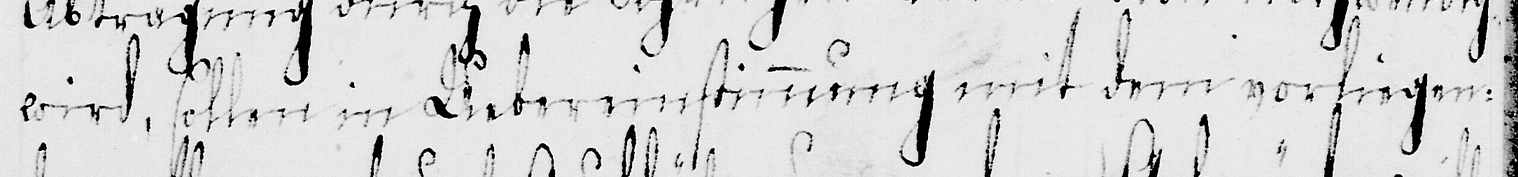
wird, sollen in Uebereinstimmung mit dem vorliegen¬
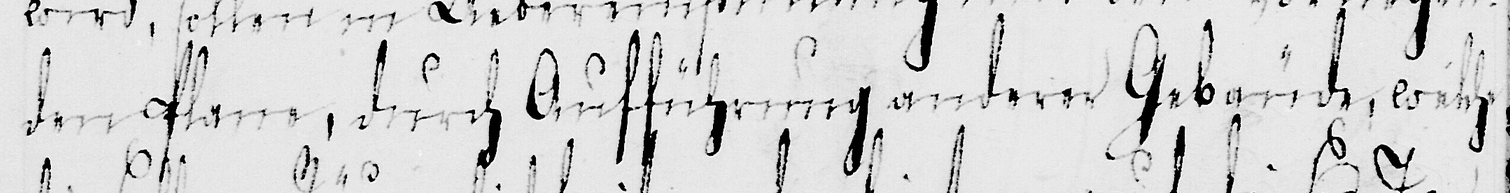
den Plane, durch Aufführung anderer Gebäude, welc¬
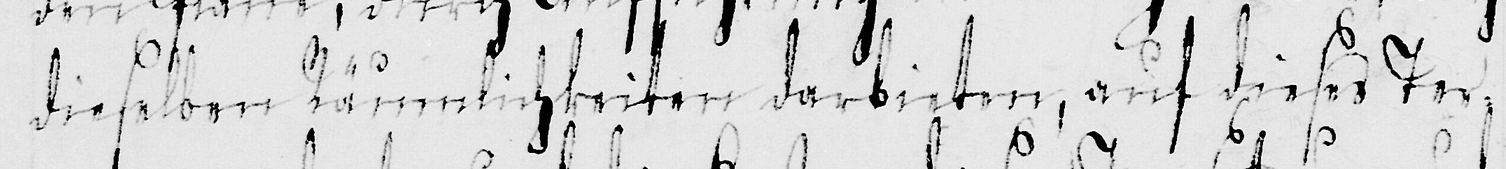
dieselben Räumlichkeiten darbieten, auf dieses Ter¬
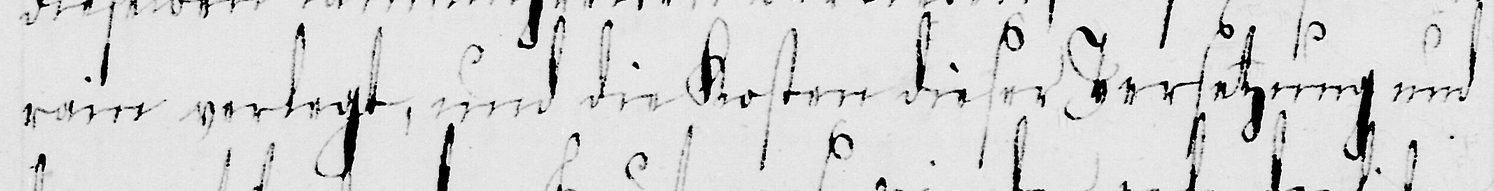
rain verlegt, und die Kosten dieser Versetzung und
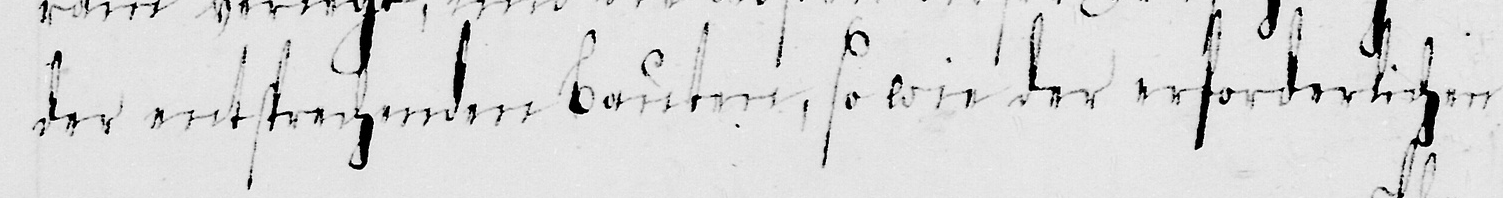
der entsprechenden Bauten, so wie der erforderlichen
